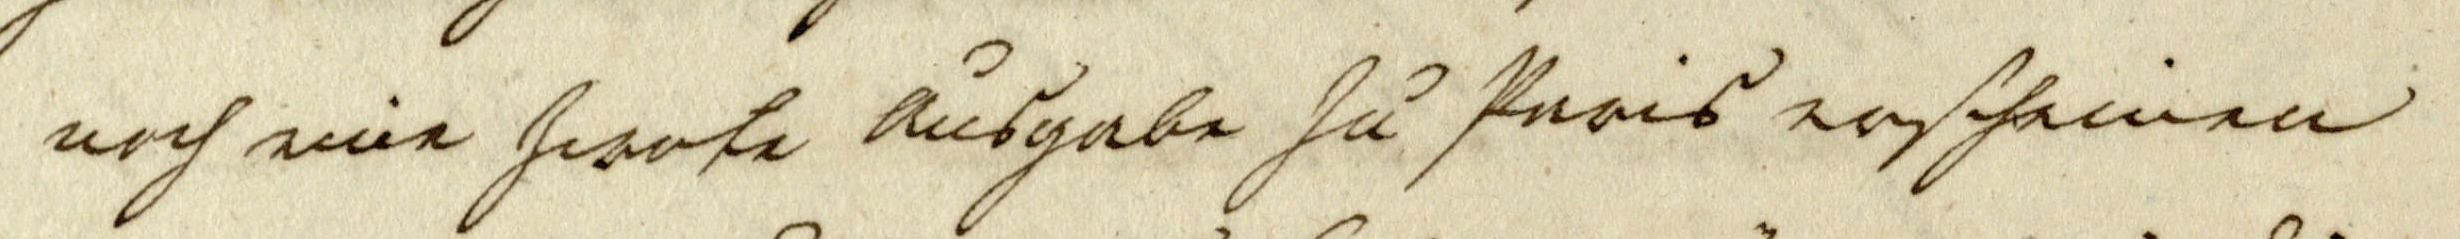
noch eine zwote Ausgabe zu Paris erscheinen
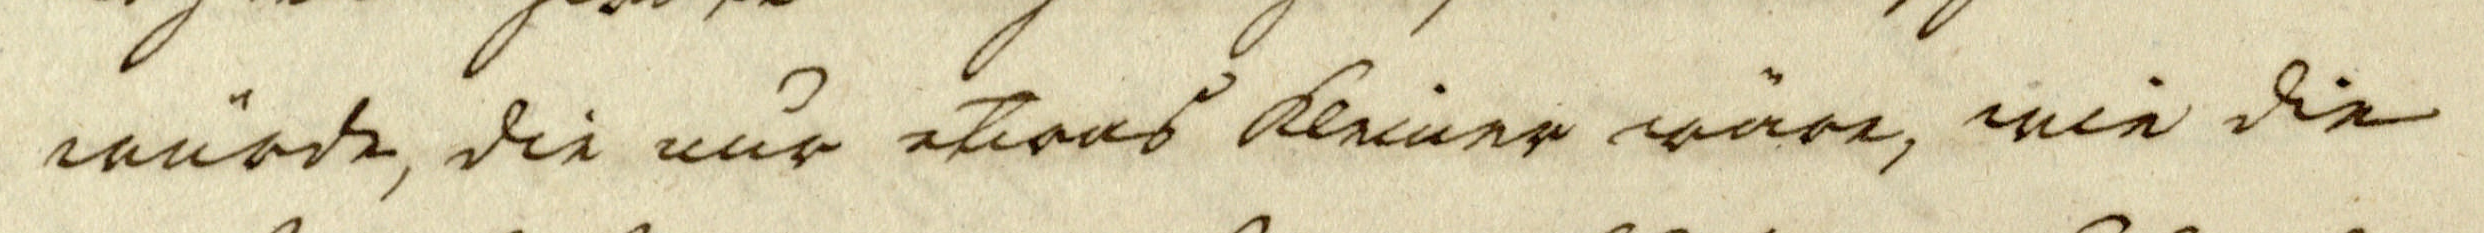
würde, die nur etwas kleiner wäre, wie die
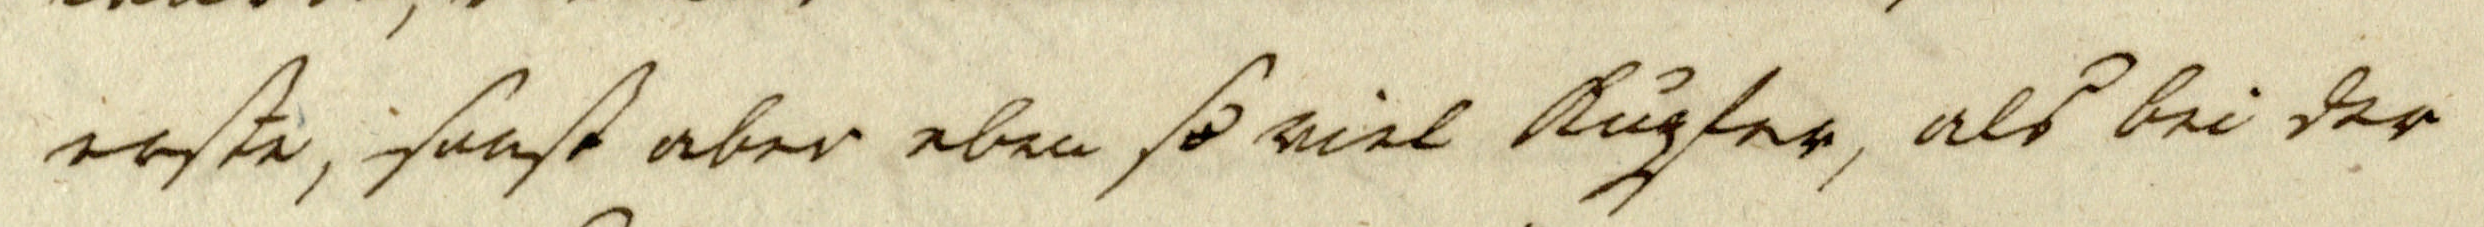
erste, sonst aber eben so viel Kupfer, als bei der
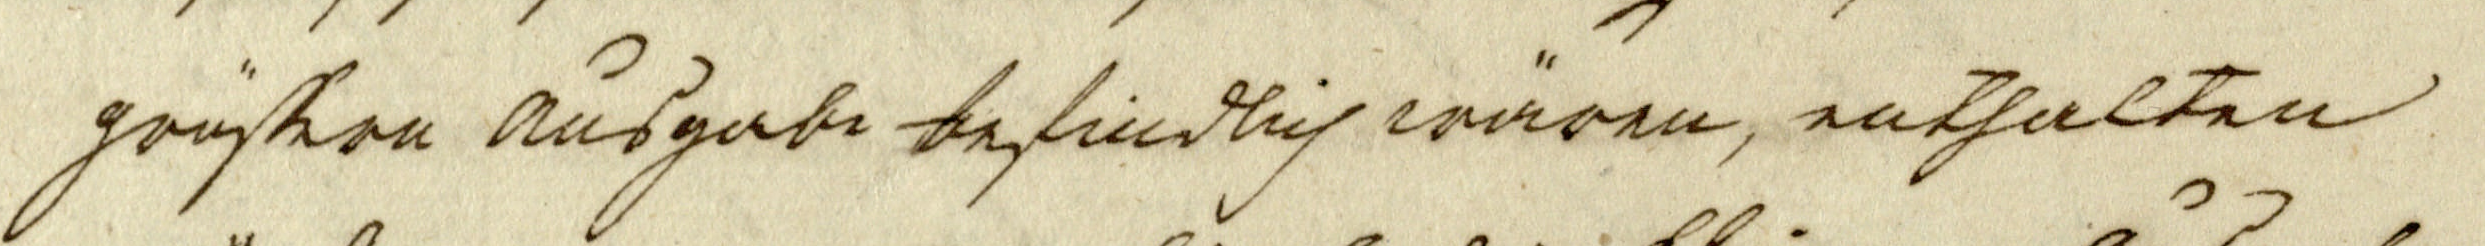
grössern Ausgabe befindlich wären, enthalten
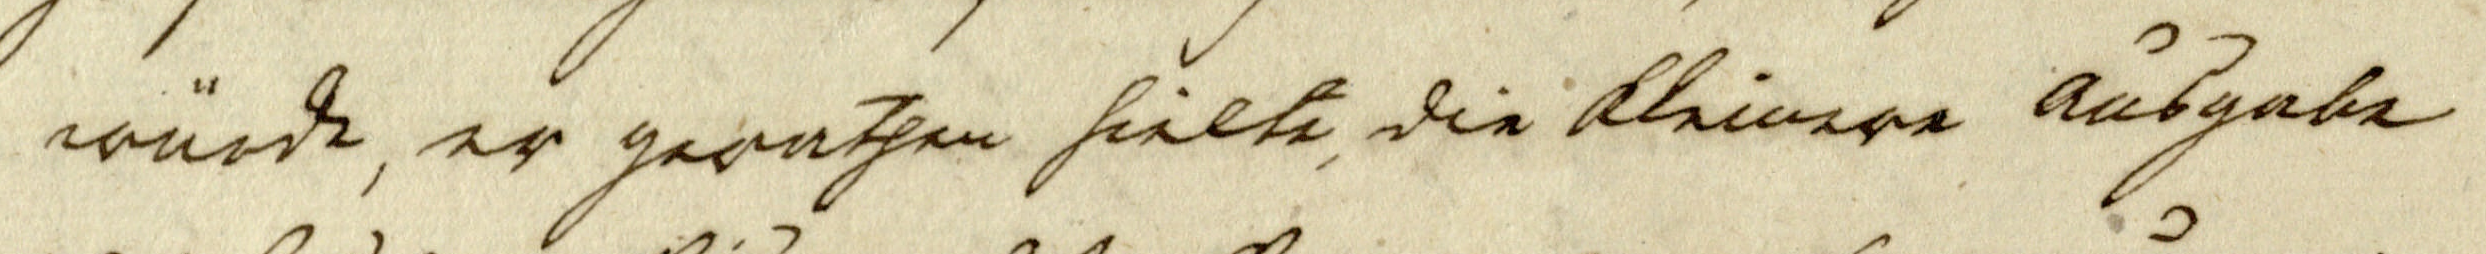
würde, er gerathen hielte, die kleinere Ausgabe
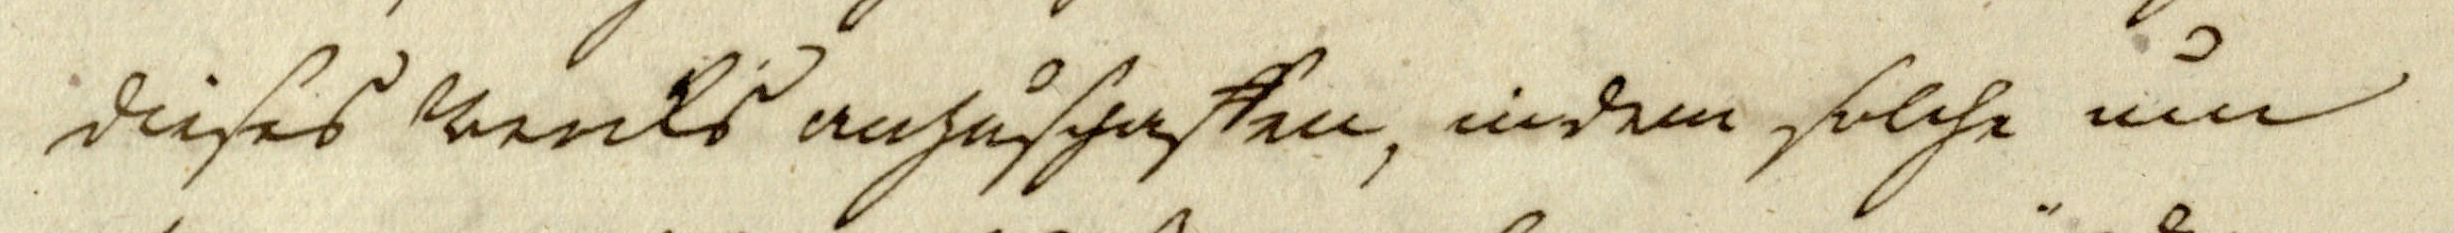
dieses Wercks anzuschaffen, indem solche um
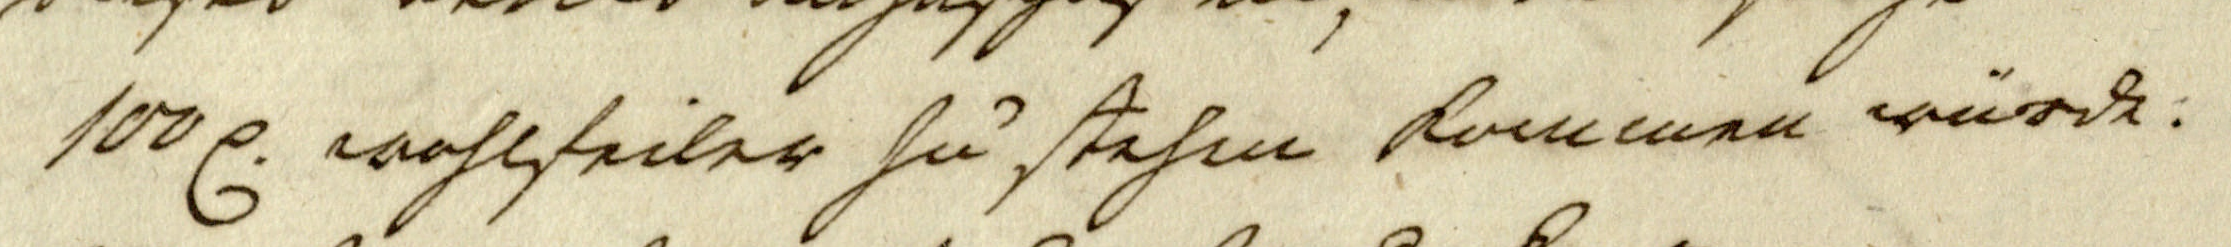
100 l. wohlfeiler zu stehen kommen würde.
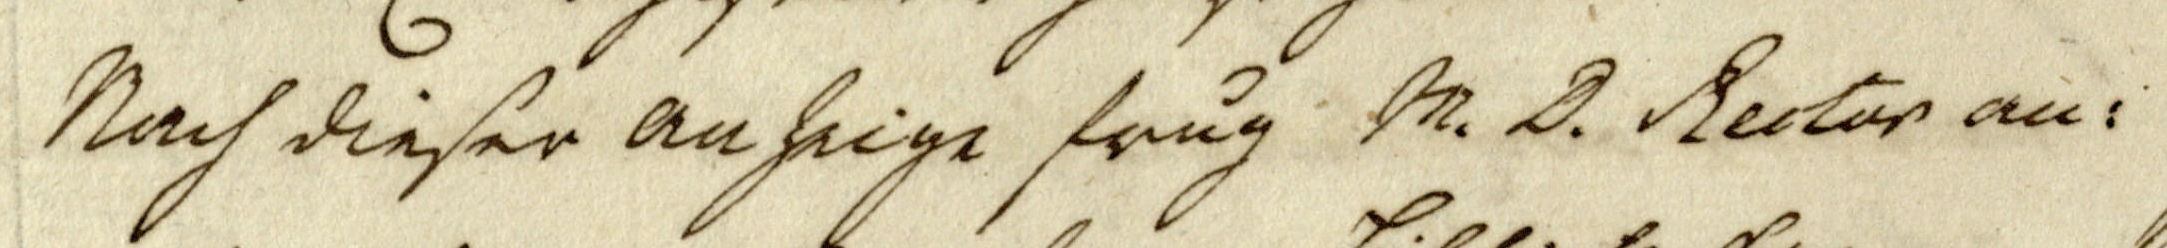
Nach dieser Anzeige frug M. D. Rector an:
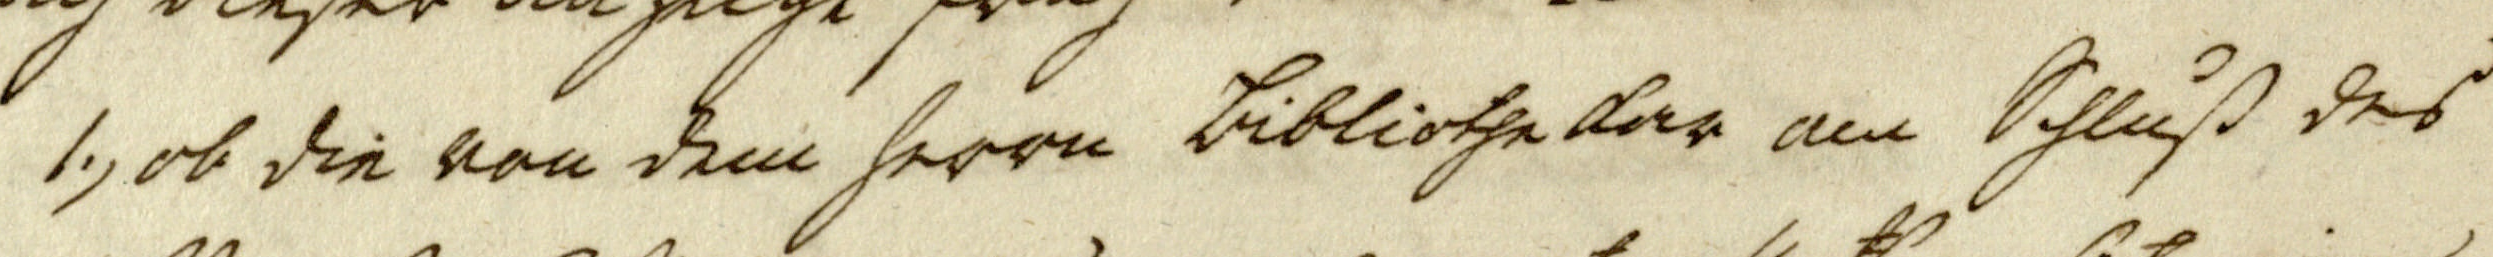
1., ob die von dem herrn Bibliothekar am Schluß des
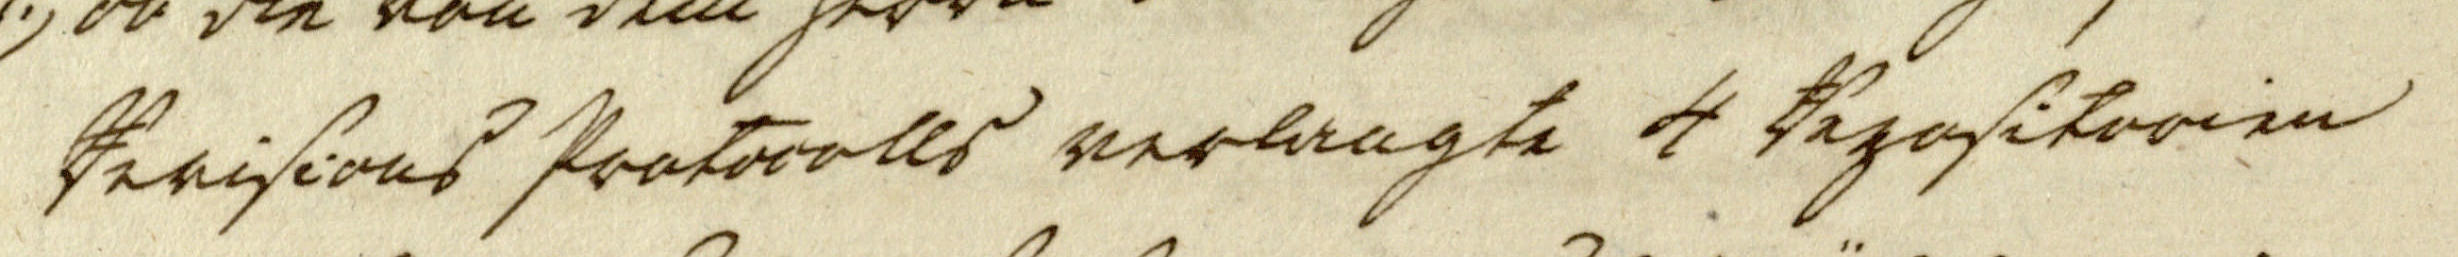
Revisions Protocolls verlangte 4 Repositorien
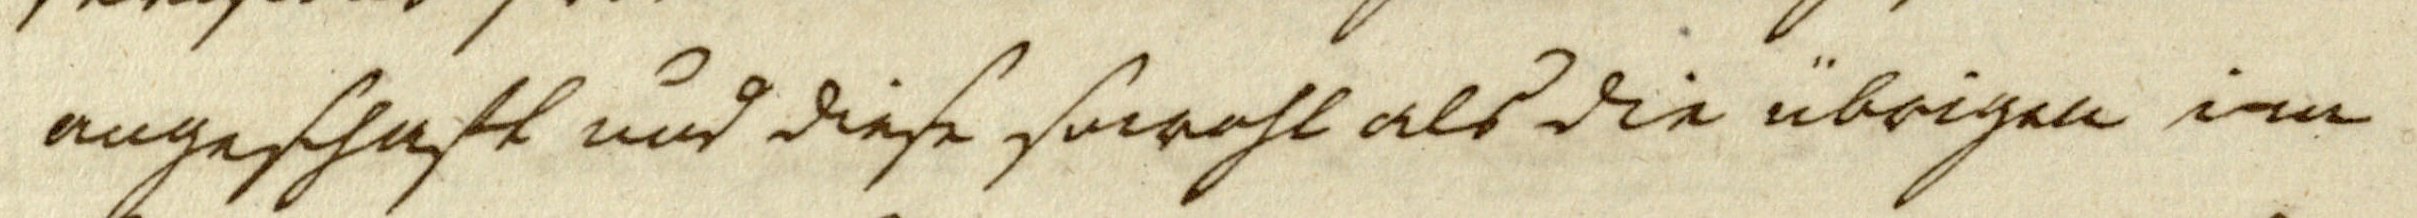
angeschaft und diese sowohl als die übrigen im
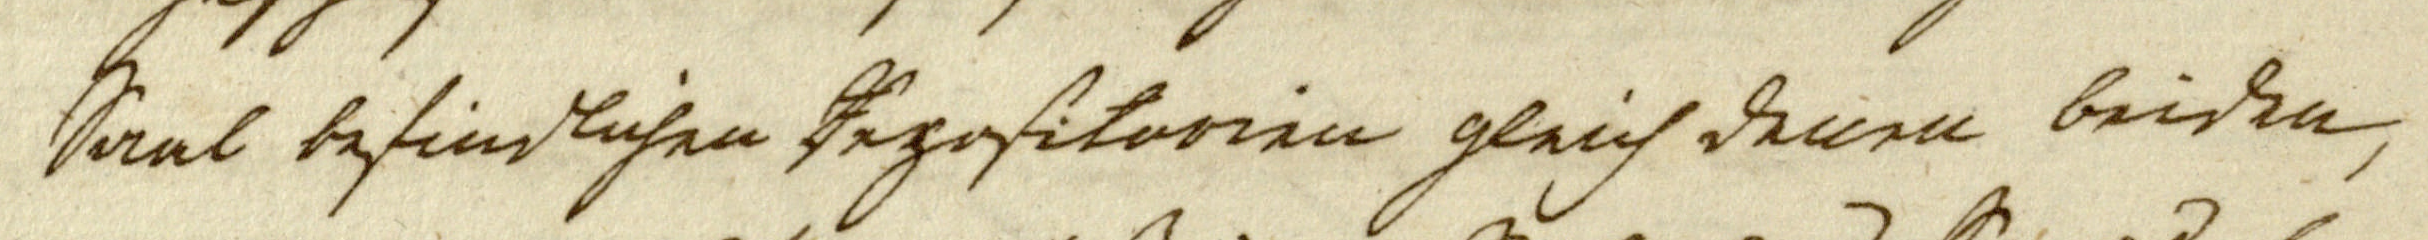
Saal befindlichen Repositorien gleich denen beiden,
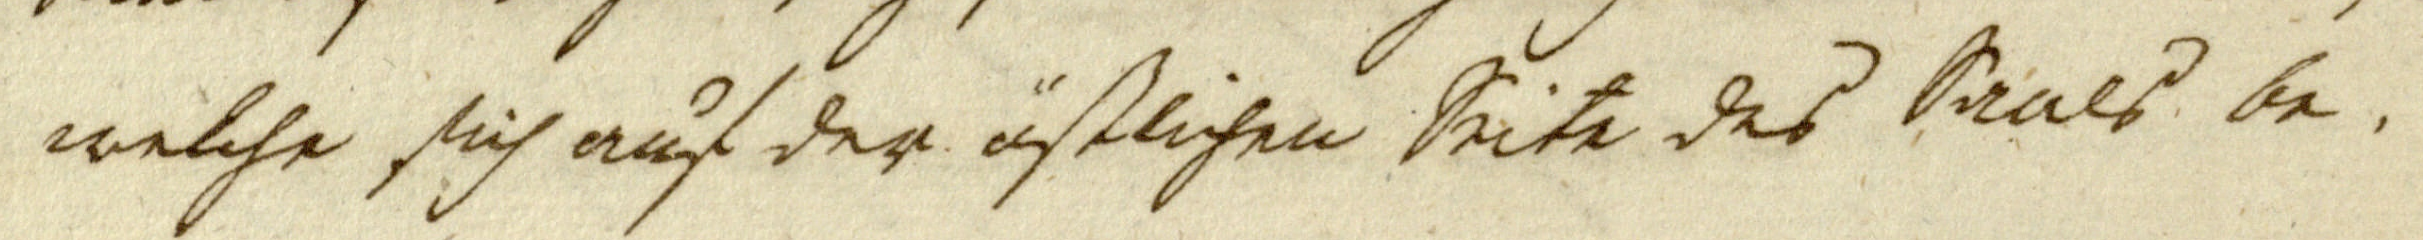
welche sich auf der östlichen Seite des Saals be¬
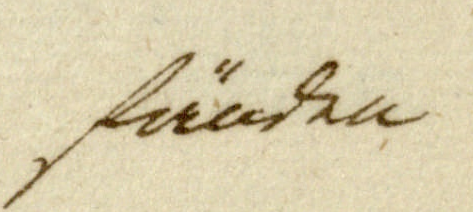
fänden
